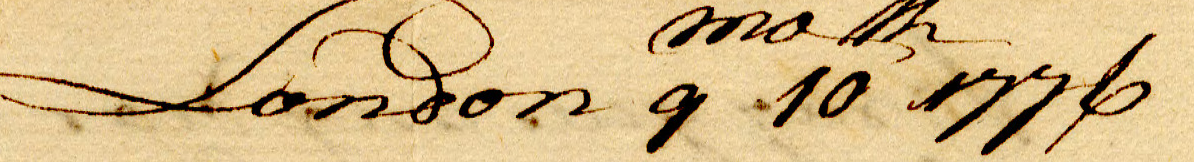London 9^mo 10^th 1776
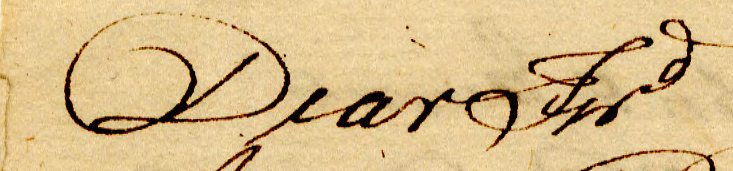Dear Fr^d
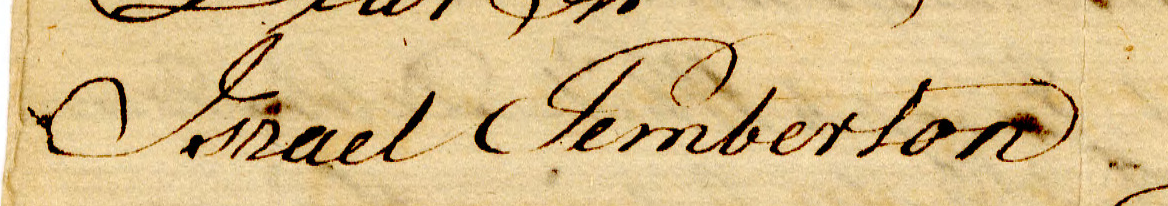Israel Pemberton
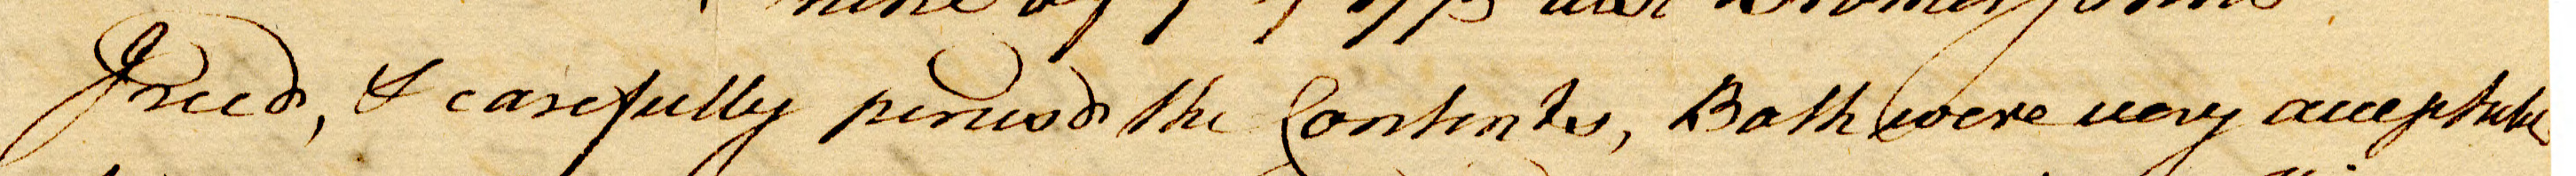I recd, & carefully perusd the Contents, Both were very acceptable
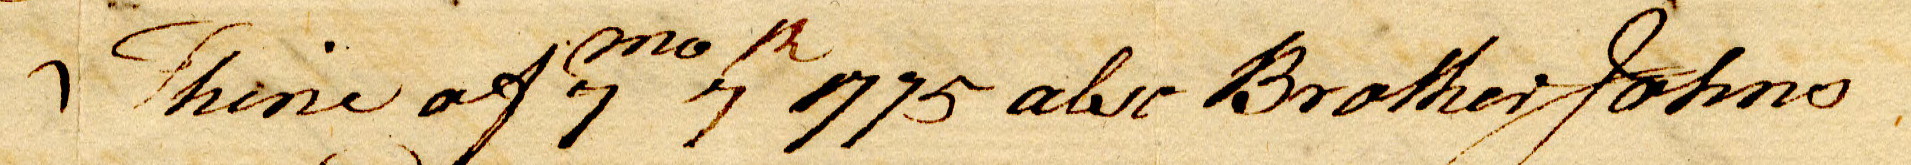Thine of 7^mo 7^th 1776 also Brother Johns
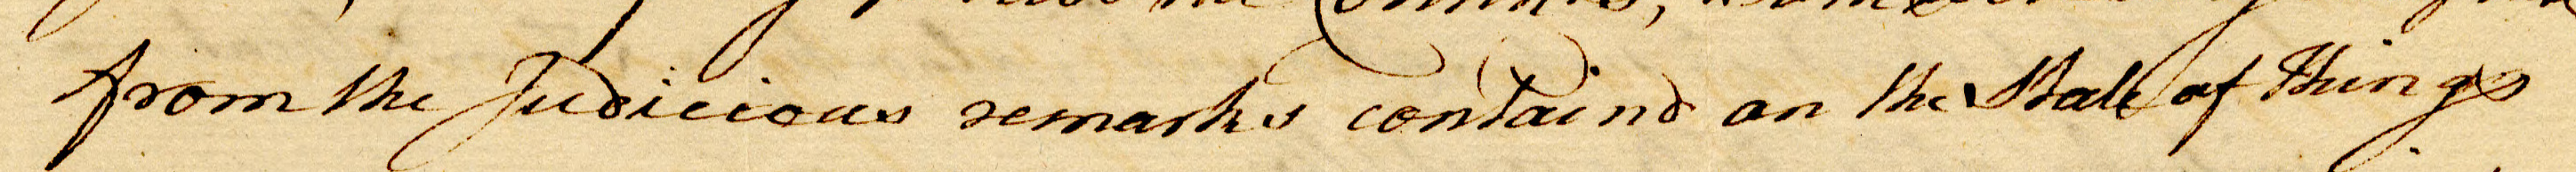from the Judicious remarks containd on the State of Things
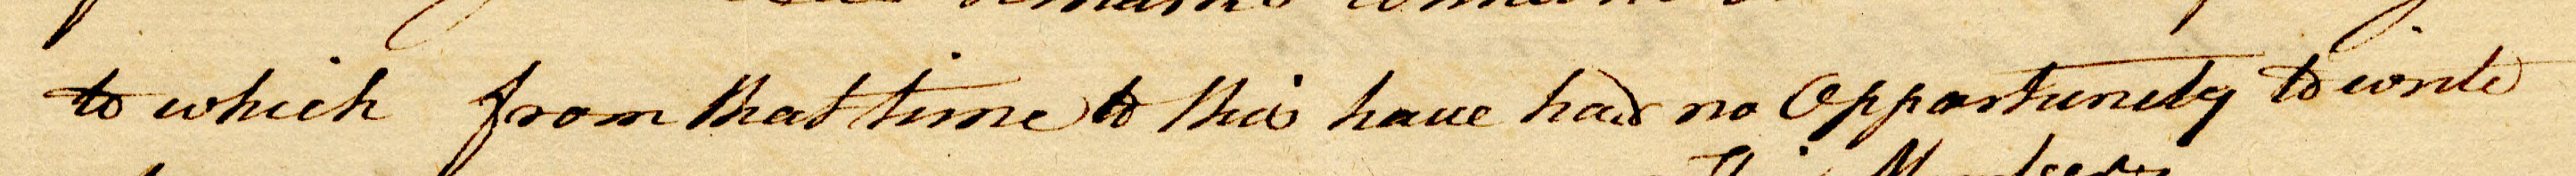to which from that time & this have had no Opportunity to write
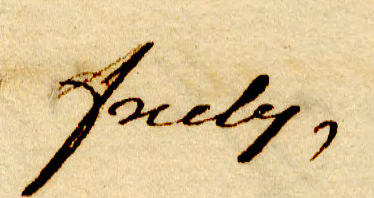freely,
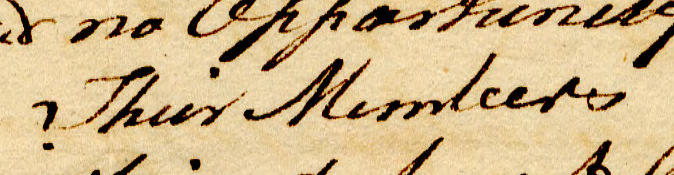Their Members
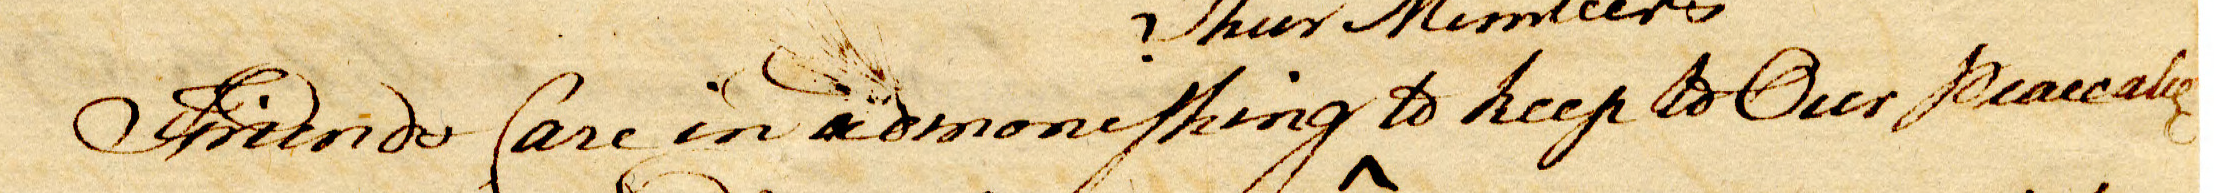Friends Care in admonishing ^ to keep to our peaceful
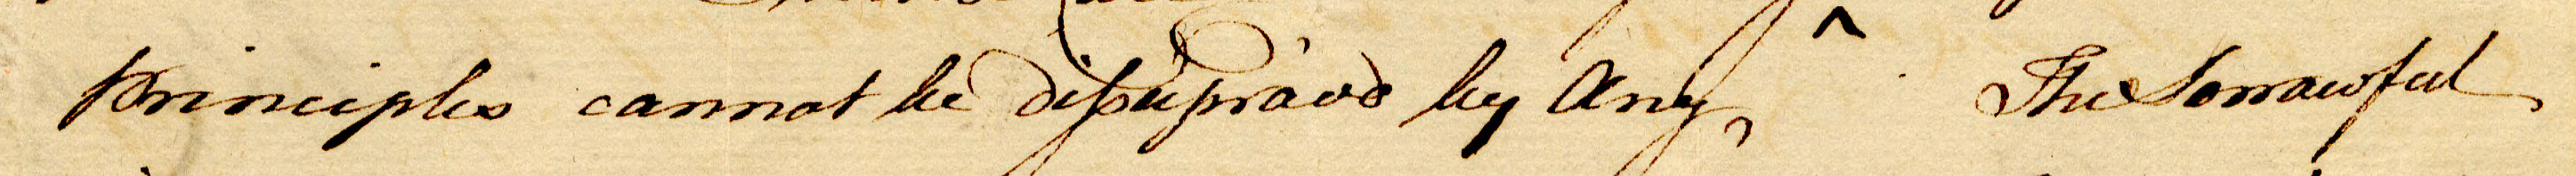principles cannot be dissaprov'd by any, The Sorrowful
